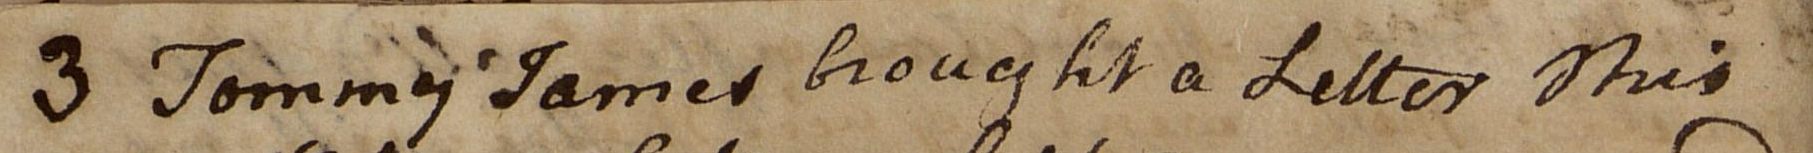3 Tommy James brought a Letter this
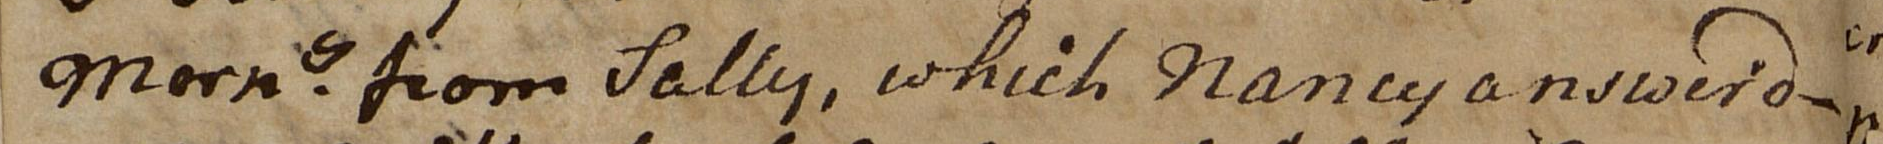morn^g fom Sally, which Nancy answer'd-
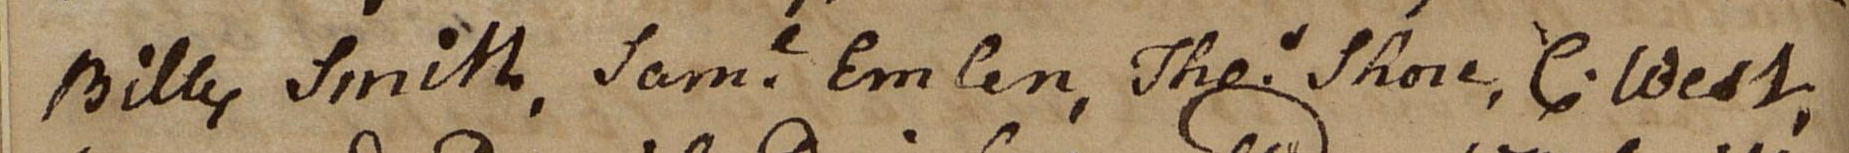Billy Smith, Sam^l. Emlen, Tho.^s Shore, C. West,
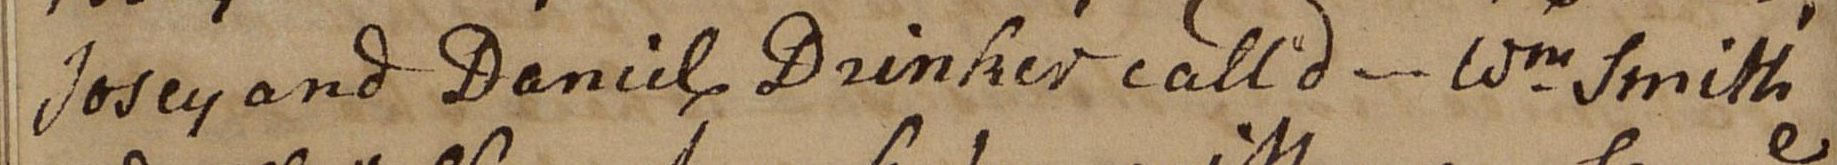Josey and Daniel Drinker call'd- W^m. Smith
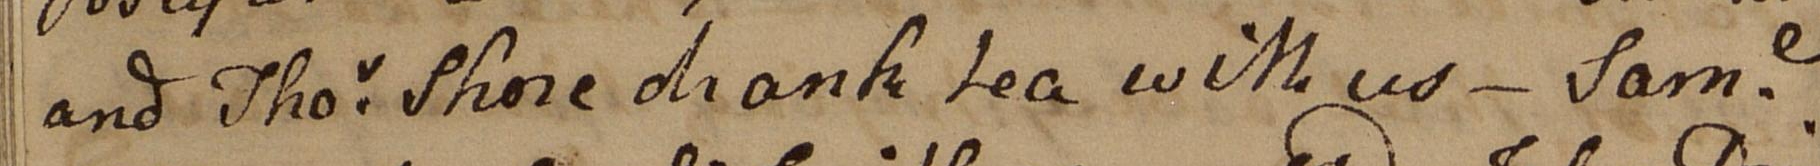and Tho^s. Shore drank tea with us- Sam^l-
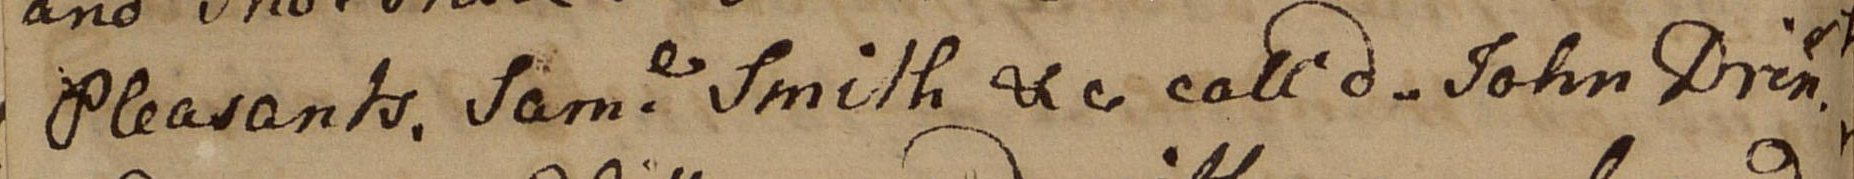Pleasants, Sam^l. Smith &c call'd- John Drin
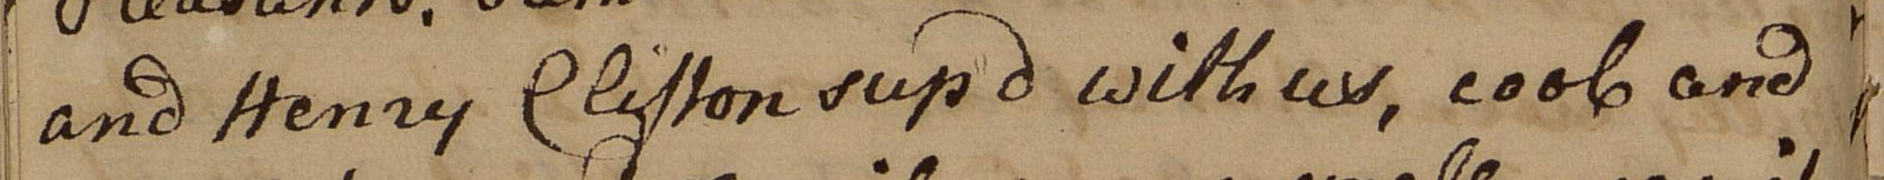and Henry Clifton sup'd with us, cool and
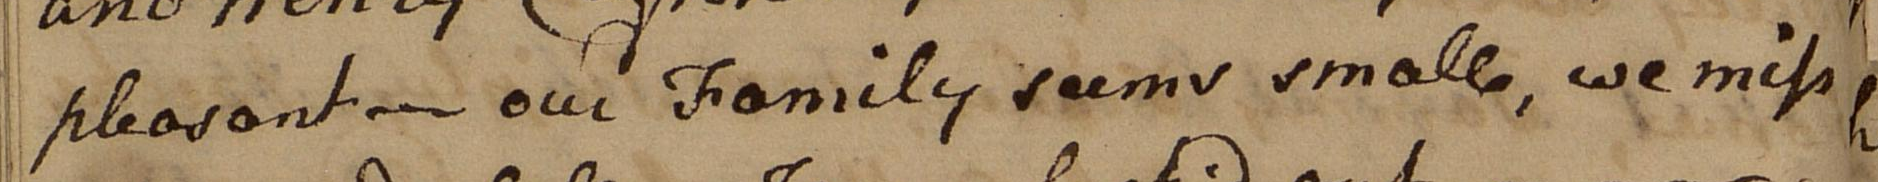pleasant- our Family seems small, we miss
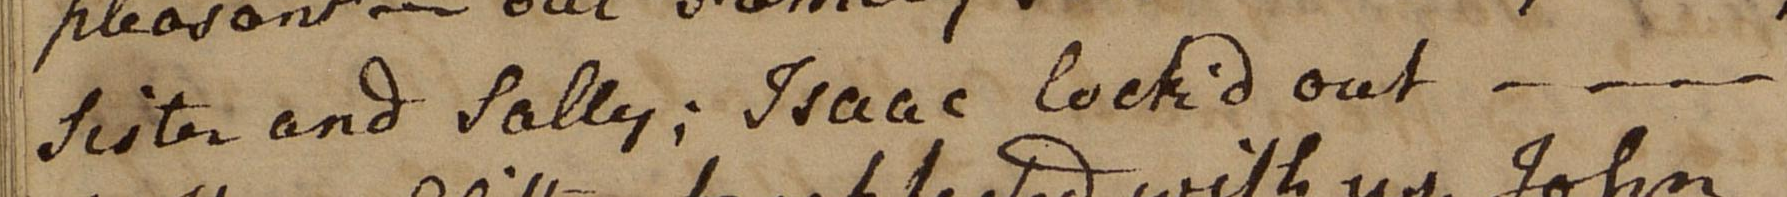Sister and Sally; Isaac lock'd out--
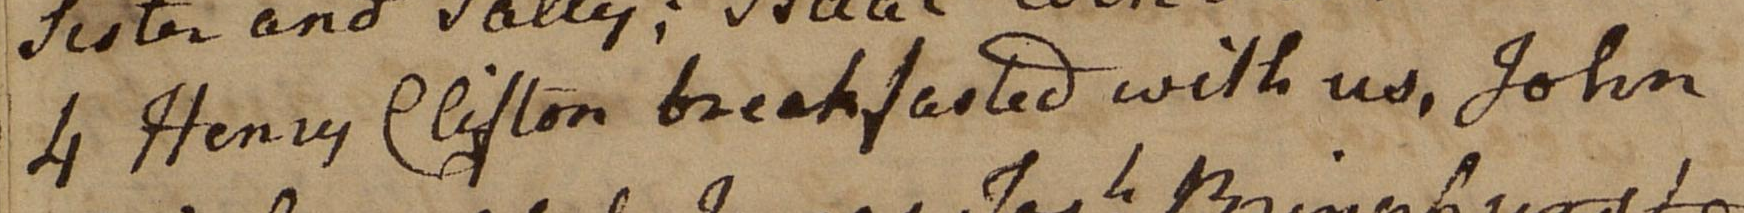4 Henry Clifton breakfasted with us, John
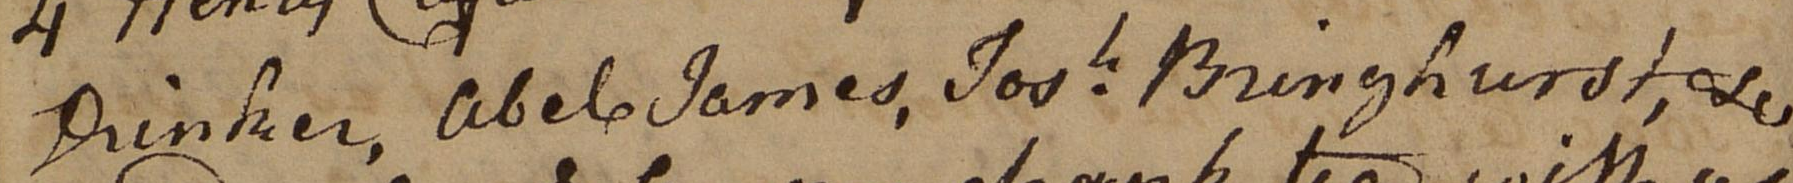Drinker, Abel James Jos^h. Bringhurst, &c
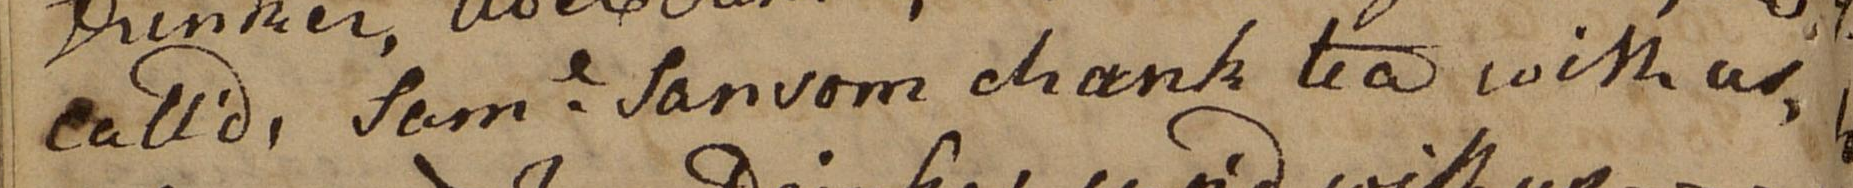call'd, Sam^l Sansom drank tea with us
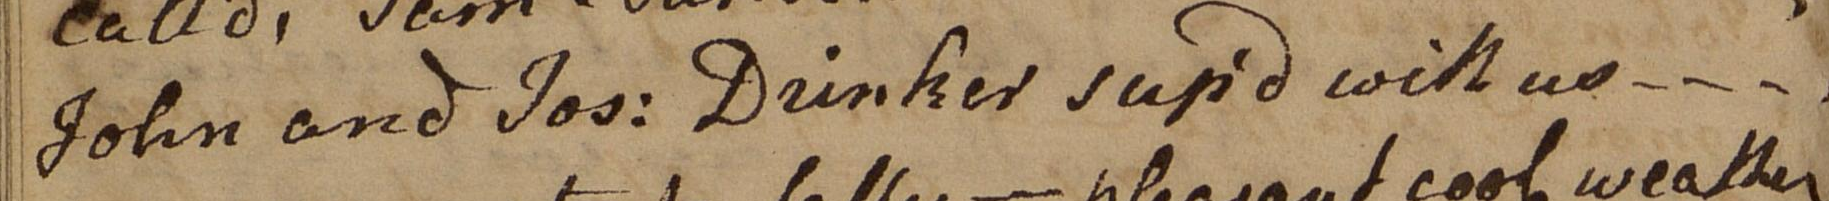John and Jos: Drinker sup'd with us---
